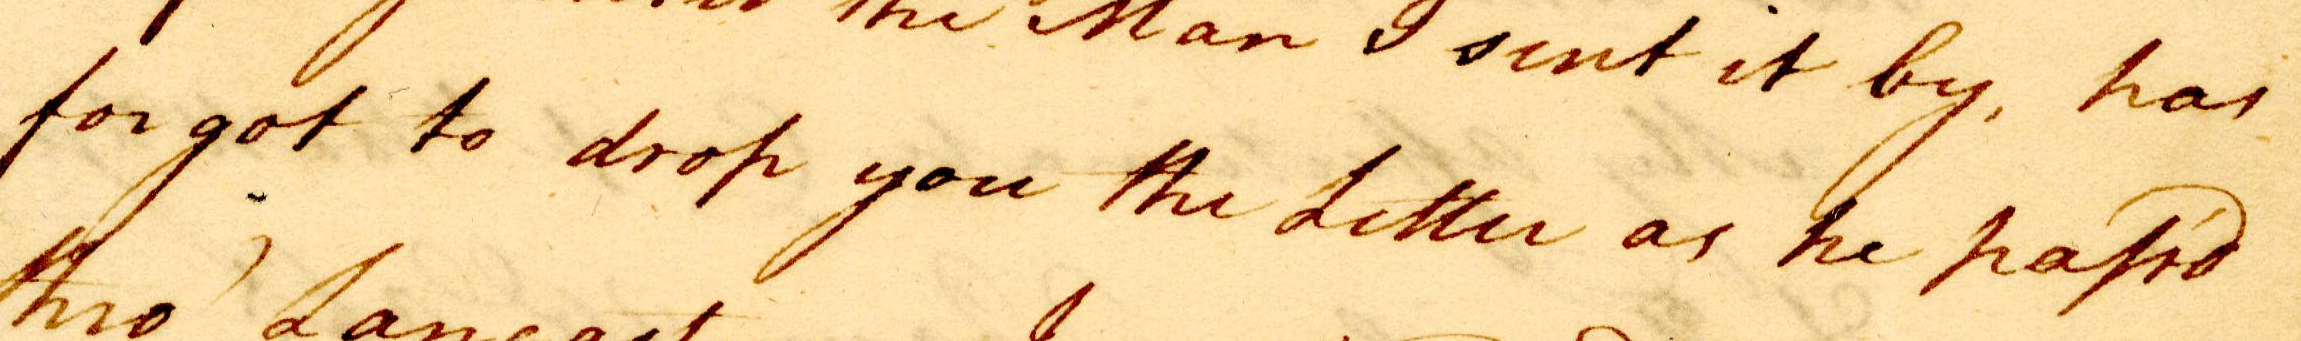for got to drop you the Letter as he pass'd
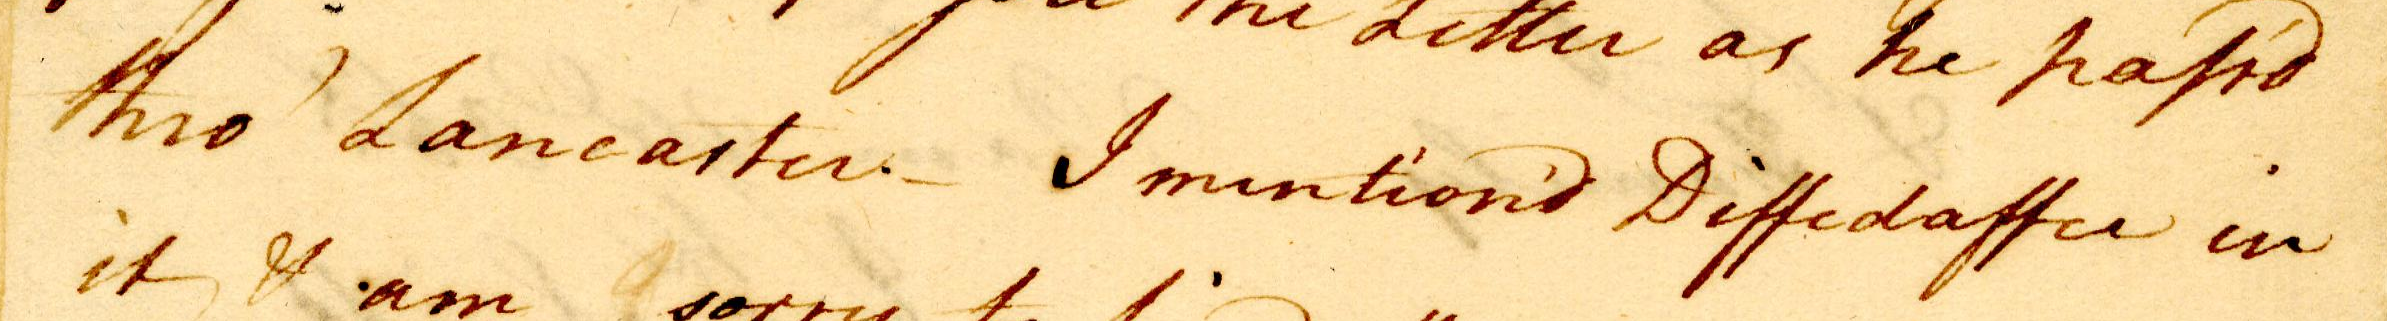thro' Lancaster. I mention'd Diffedaffer in
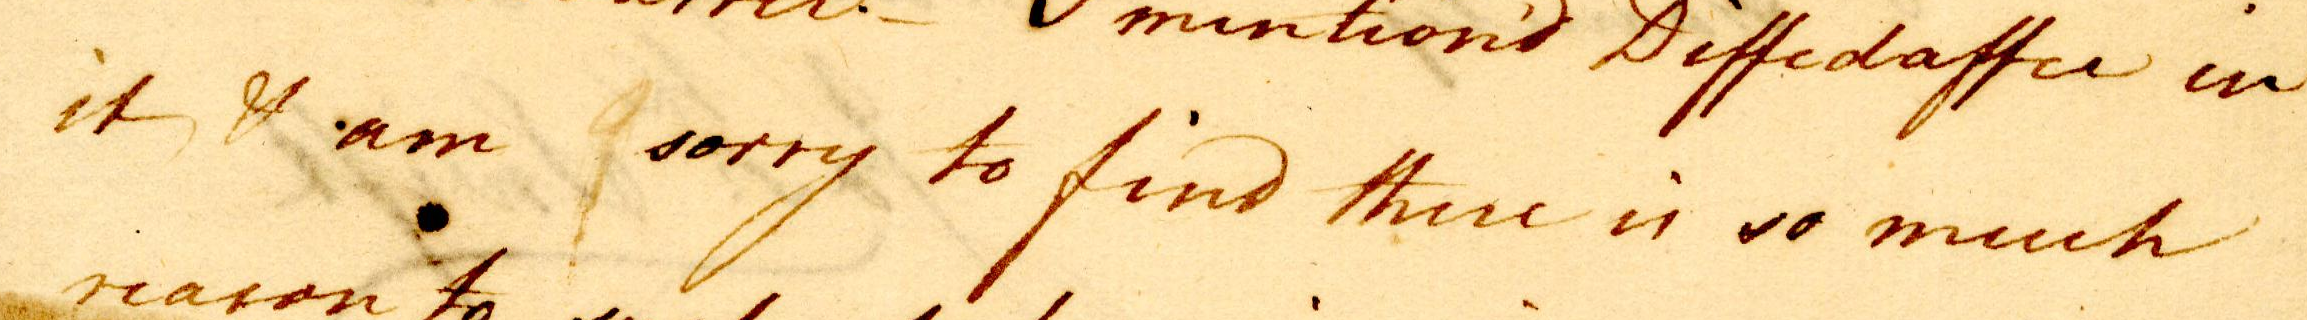it & am sorry to find there is so much
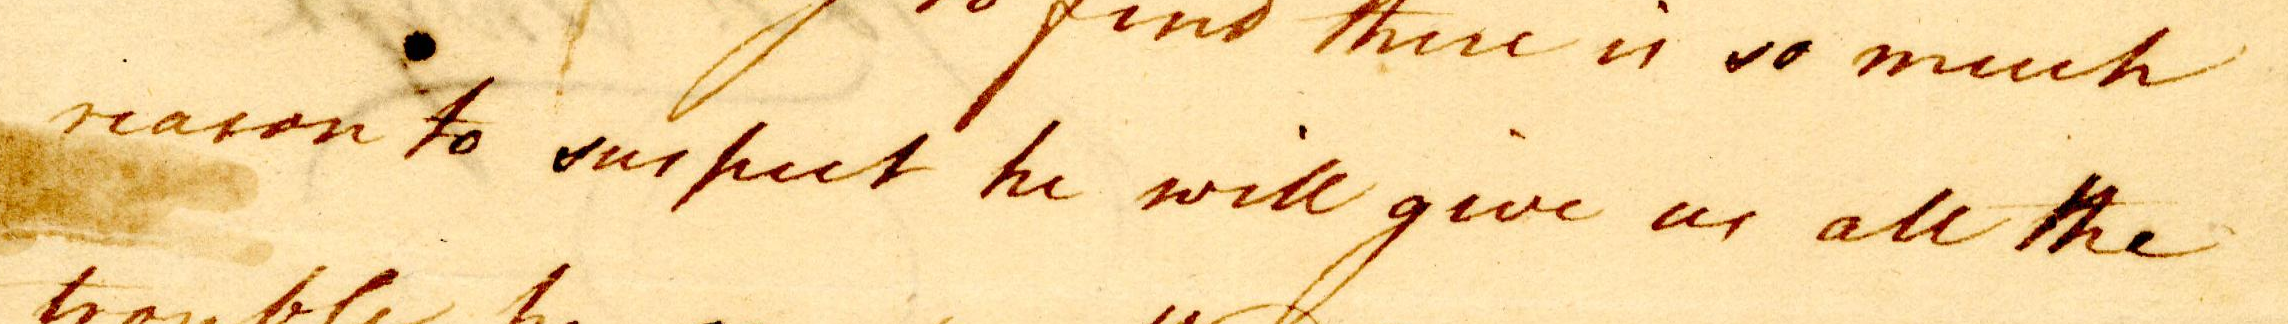reason to suspect he will give us all the
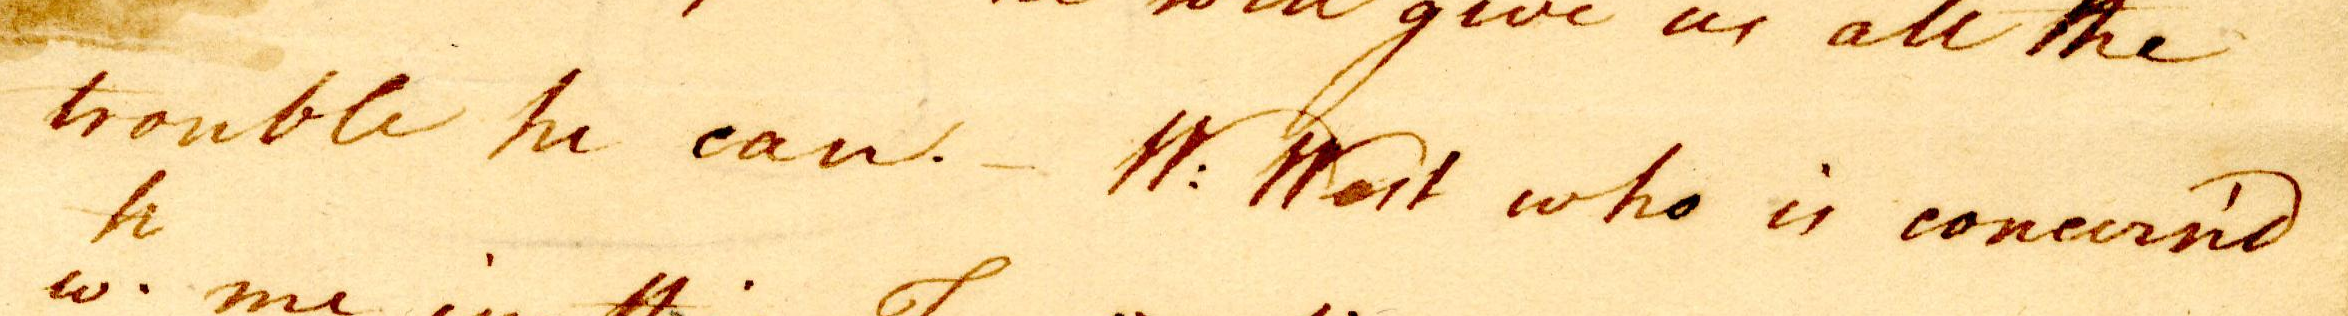trouble he can. W: West who is concern'd
